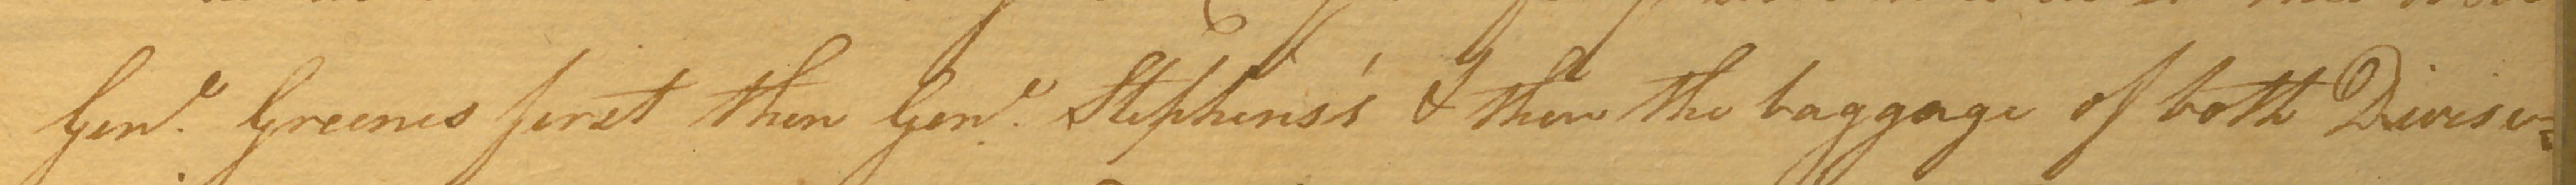Gen^l. Greenes first then Ge^l. Stephens's & then the baggage of both Divisi
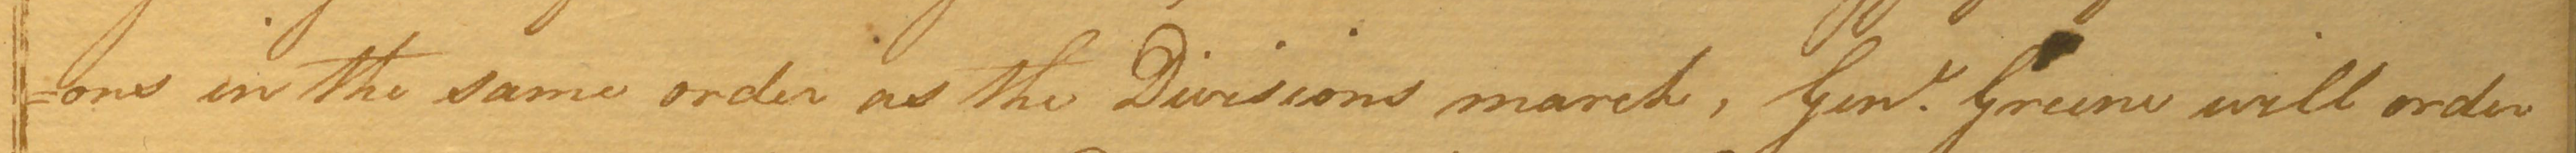-ons in the same order as the Divisions march. Gen^l. Greene will order
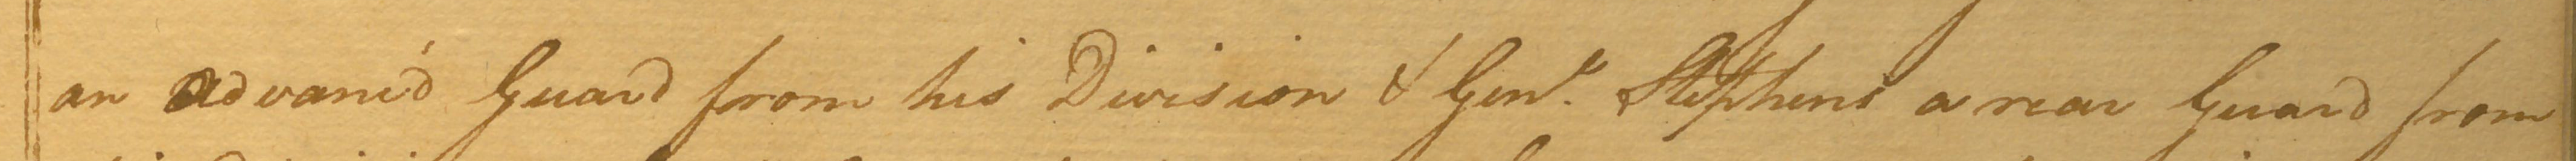an advanc'd Guard from his Division & Gen^l. Stephens a rear Guard from
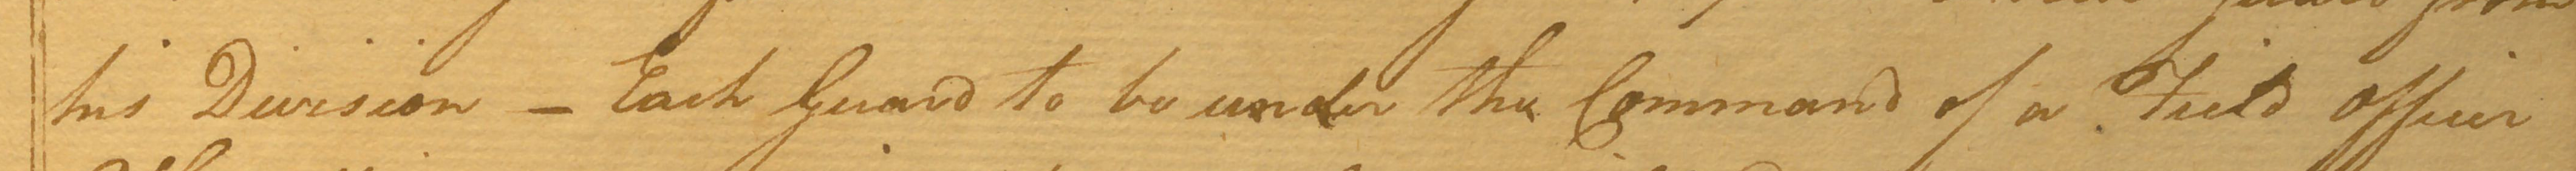his Division- Each Guard to be under the Command of a Field Officer
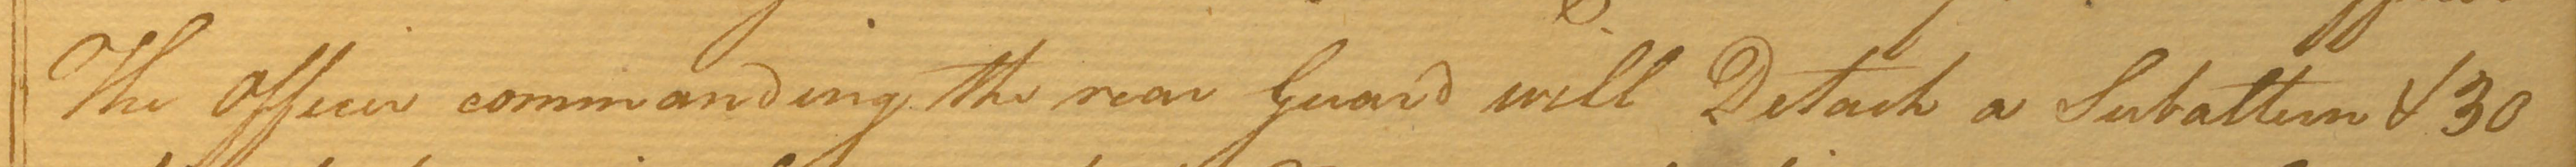The Officer commanding the rear Guard will Detach a Subaltern & 30
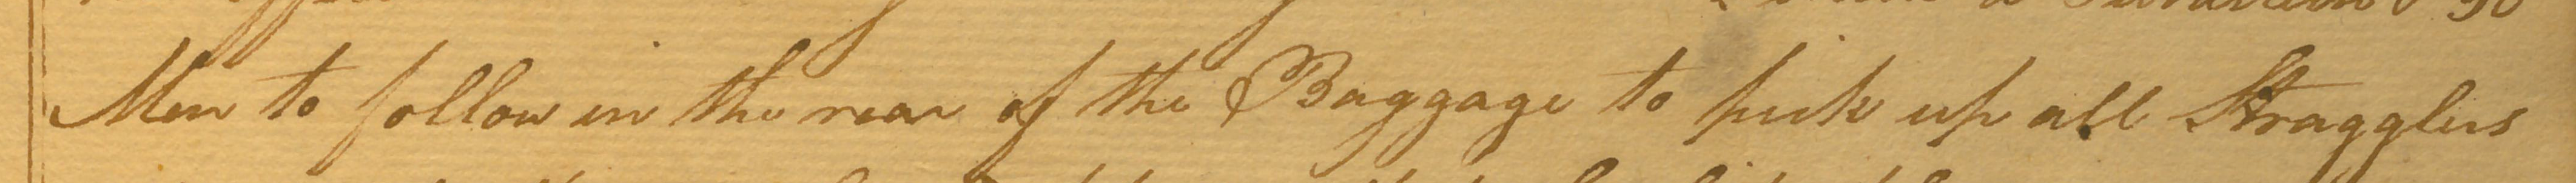Men to follow in the rear of the Baggage to pick up all Stragglers
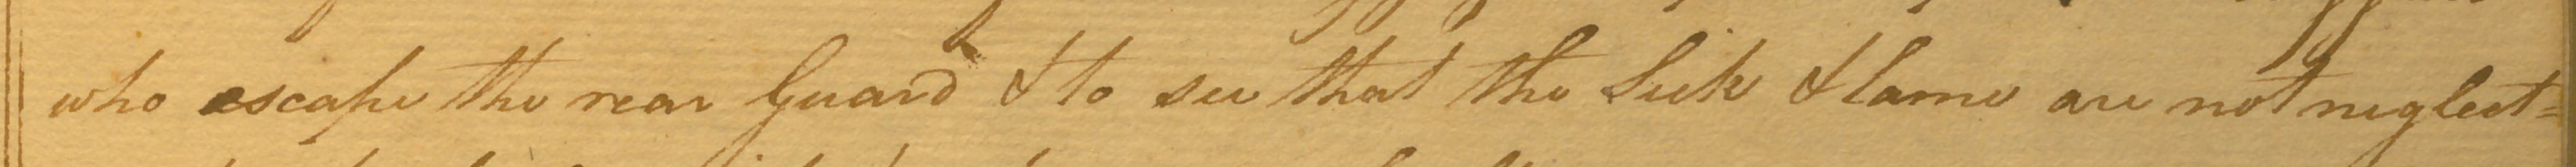who escape the rear Guard & to see that the Sick & lame are not neglect
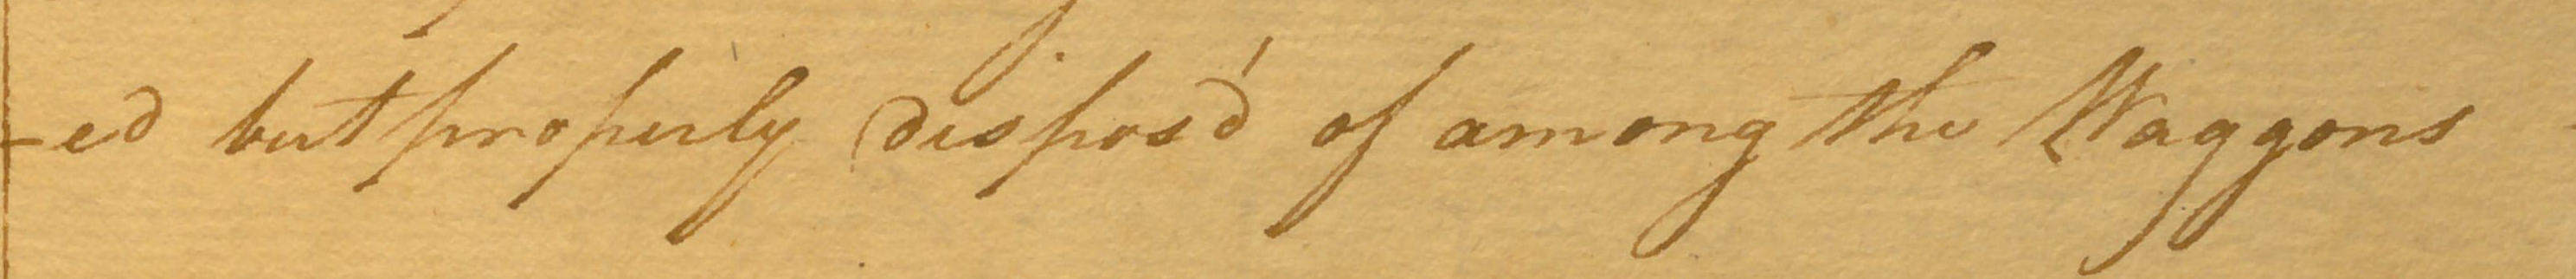-ed but properly dispos'd of among the Waggons-
